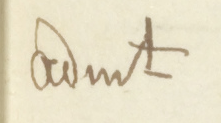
Admt.
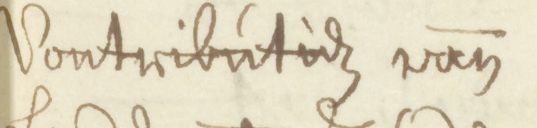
Contributien van
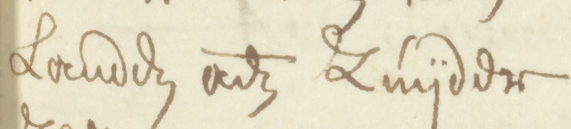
Landen aen Zuijder
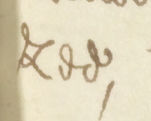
Zee,
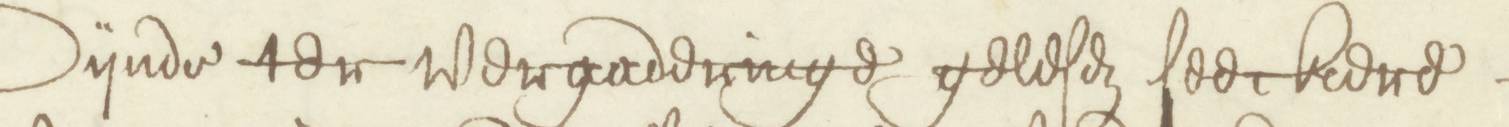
Sijnde ter Vergaderinge gelesen seeckere
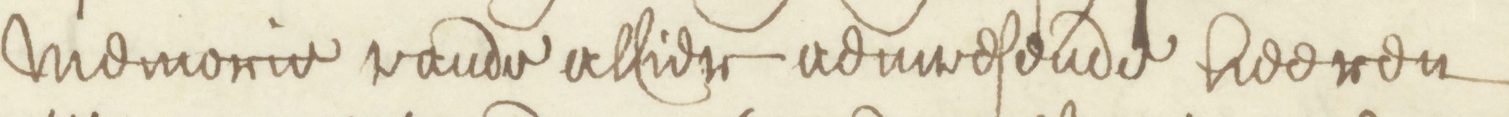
memorie vande alhier aenwesende heeren
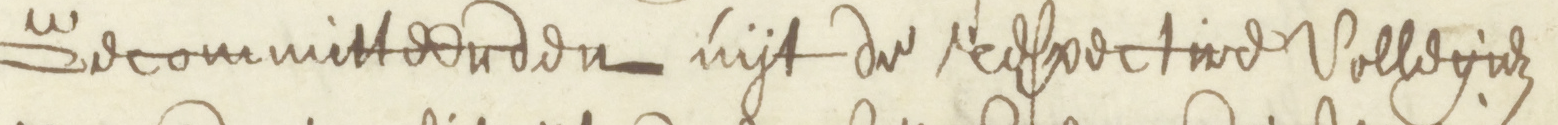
Gecommitteerden uijt de respective Collegien
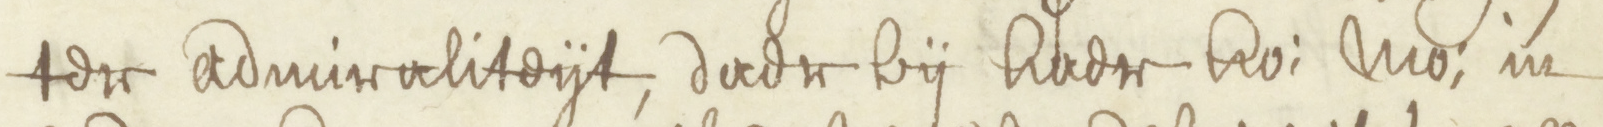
ter Admiraliteijt, daer bij haer Ho:Mo: in
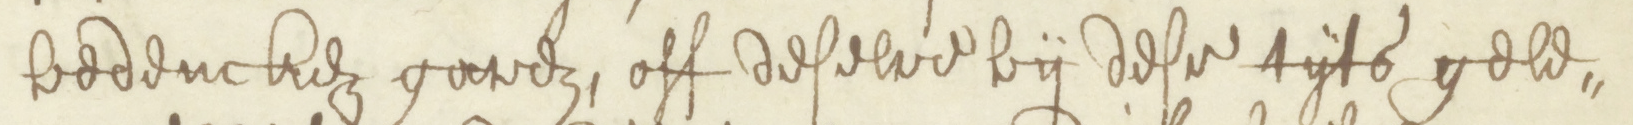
bedencken gaven, off deselve bij dese tijts gele„
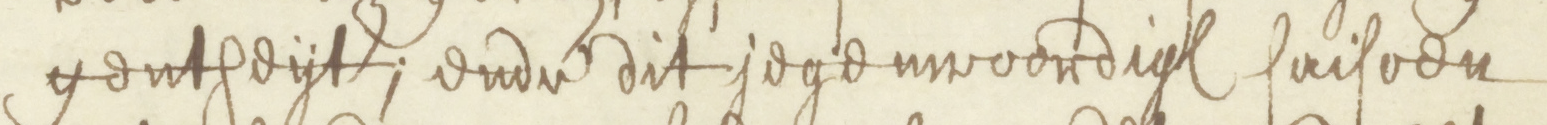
gentheijt; ende dit jegenwoordigh saisoen
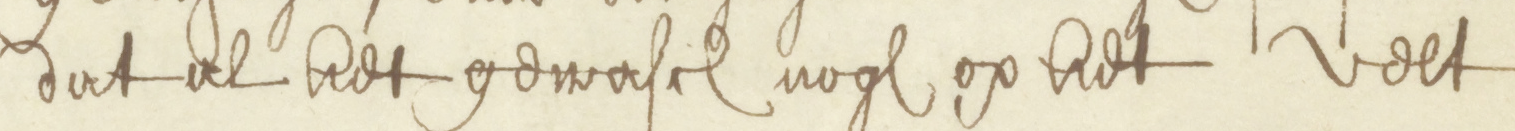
dat al het gewasch nogh op het velt
